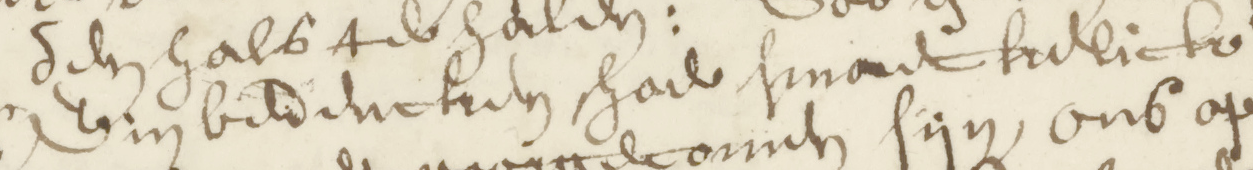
U E in bedencken, hoe smaeckelick
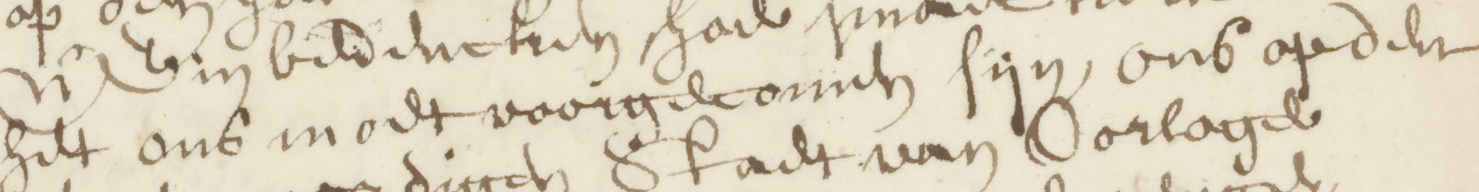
het ons moet voorgecomen sijn, ons opden
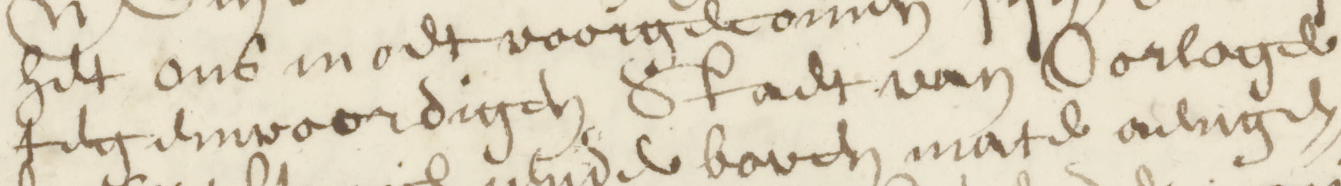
tegenwoordigen Staet van Oorloge
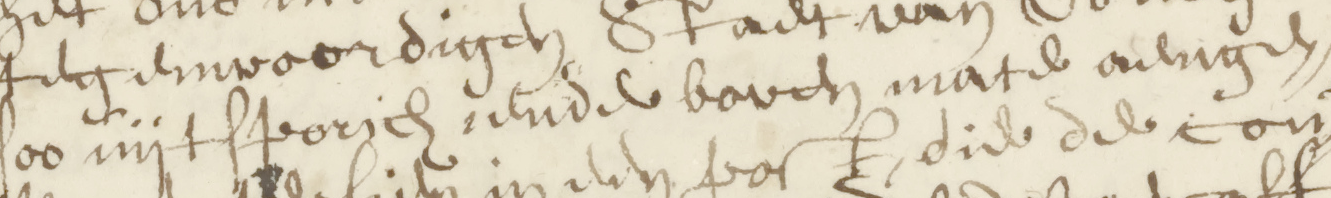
soo uijtsporich, ende boven mate aenge„
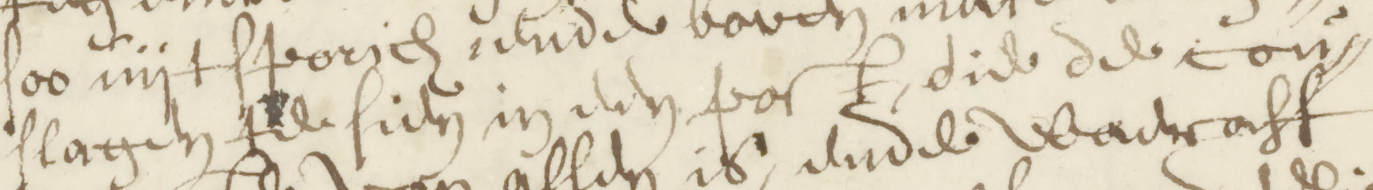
slagen te sien in een post, die de cou„
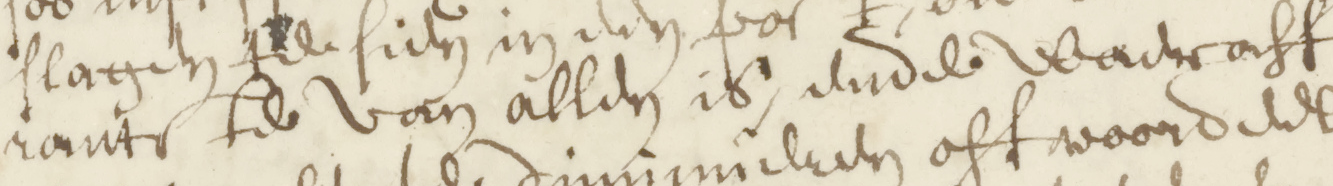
rantste van allen is, ende waeraff
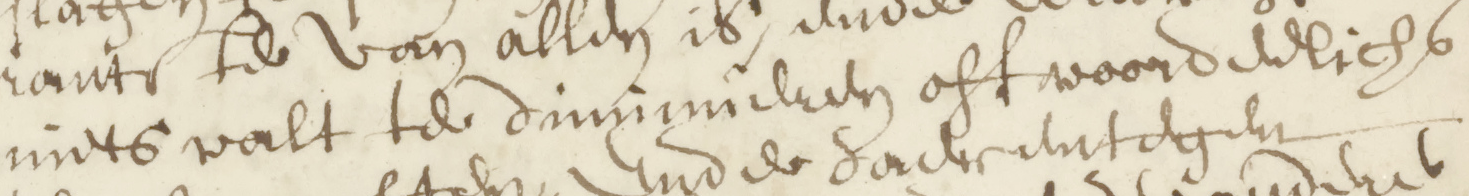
niets valt te diminueren off voordeelichs
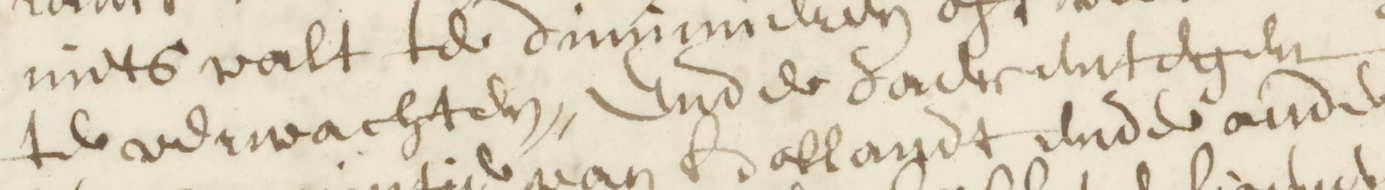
te verwachten. Ende daerentegen
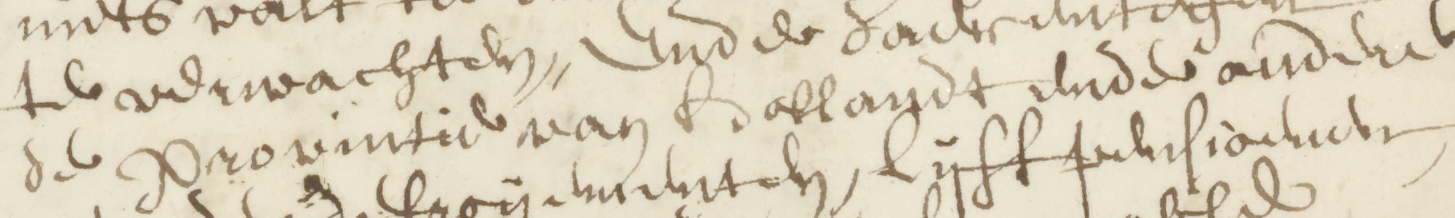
de Provintie van Hollandt ende andere
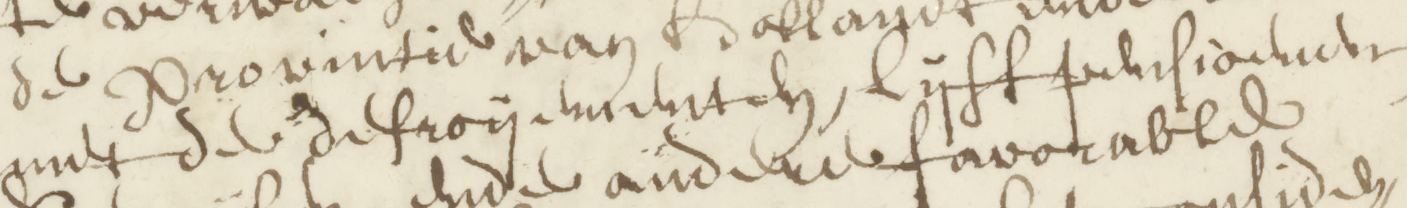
met de defroijementen, Lijffpensioenen
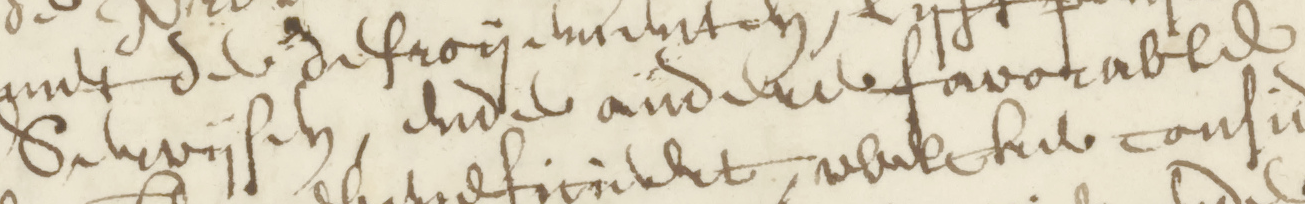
Servijsen, ende andere favorable
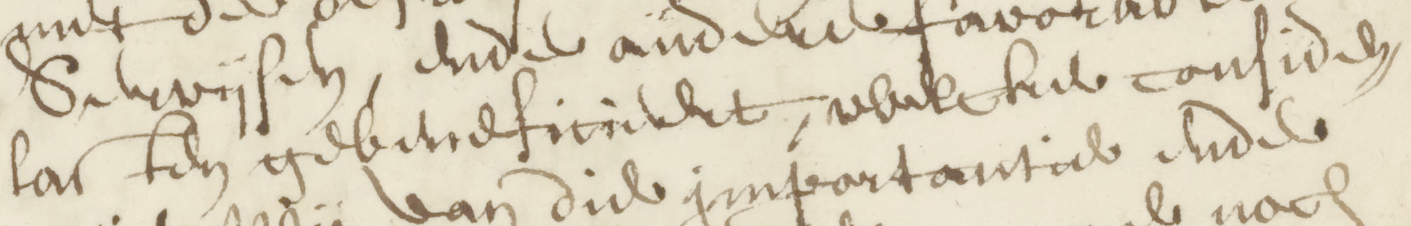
lasten gebeneficieert, welcke conside„
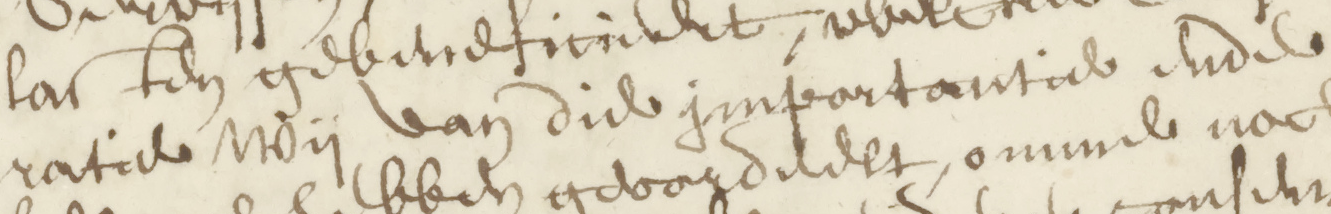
ratie Wij van die importantie ende
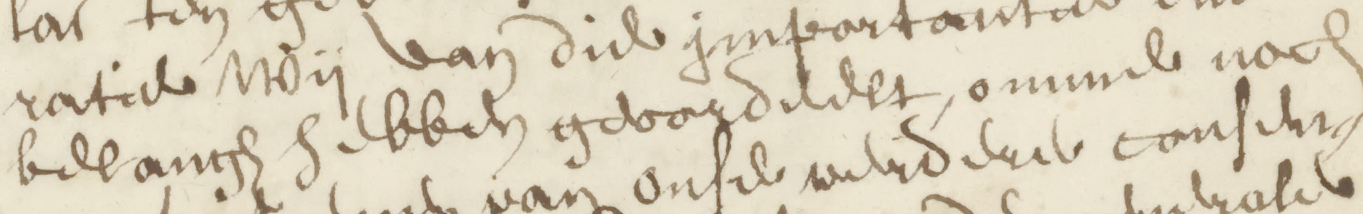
belangh hebben geoordeelt, omme noch
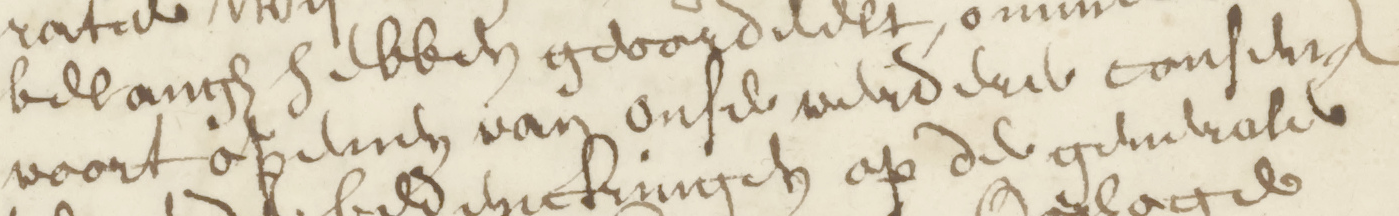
voort openen van onse verdere consen„
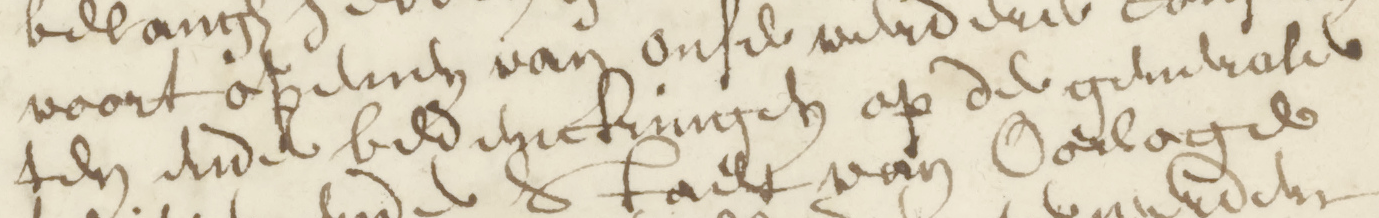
ten ende bedenckingen op de generale
